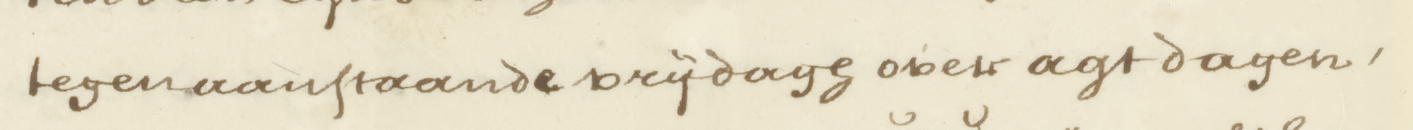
tegen aanstaande vrijdagh over agt dagen,
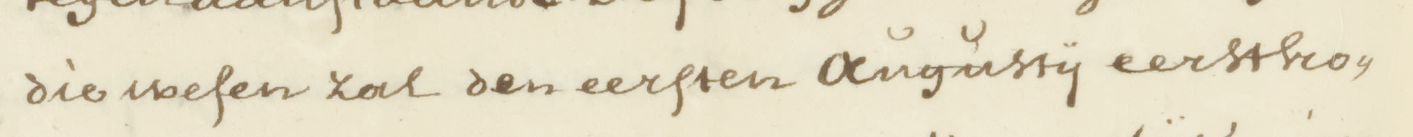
die wesen zal den eersten Augustij eerstko„
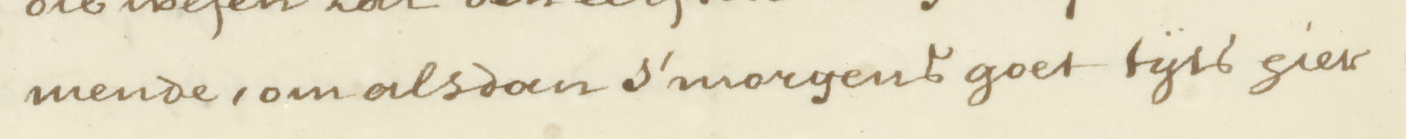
mende, om alsdan s'morgens goet tijts hier
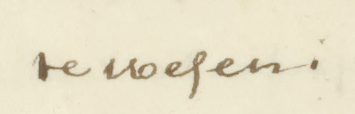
te wesen.
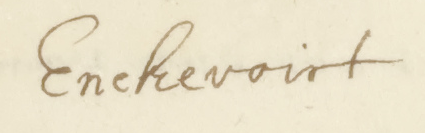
Enckevoirt
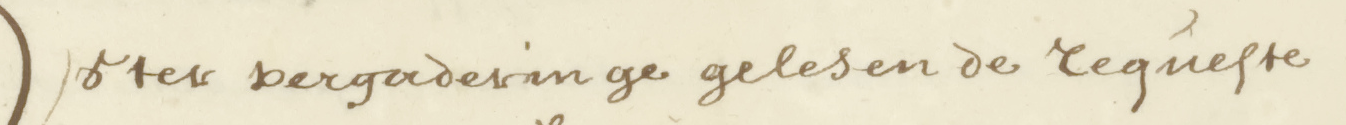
Is ter vergaderingen gelesen de requeste
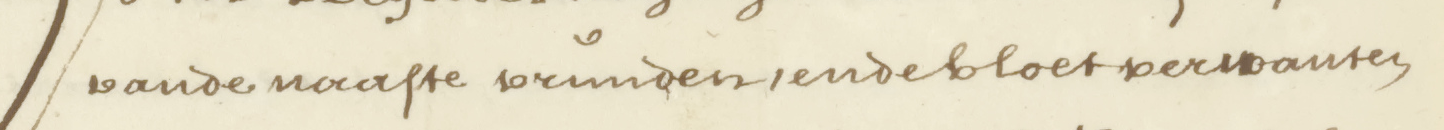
vande naaste vrunden, ende bloetverwanten
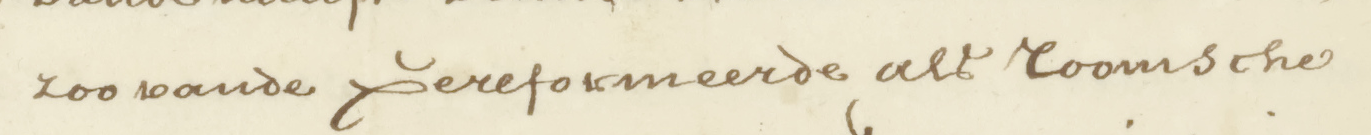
zoo vande Gereformeerde als Roomsche
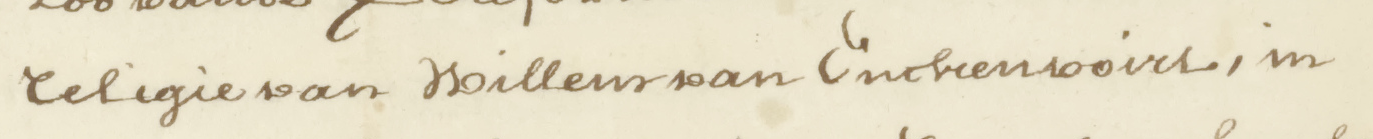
Religie van Willem van Enckenvoirt, in
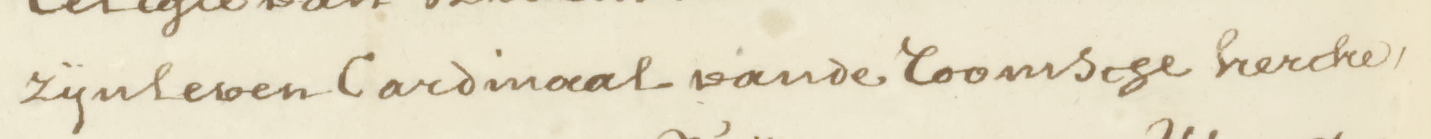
zijn leven Cardinaal vande Roomsche kercke,
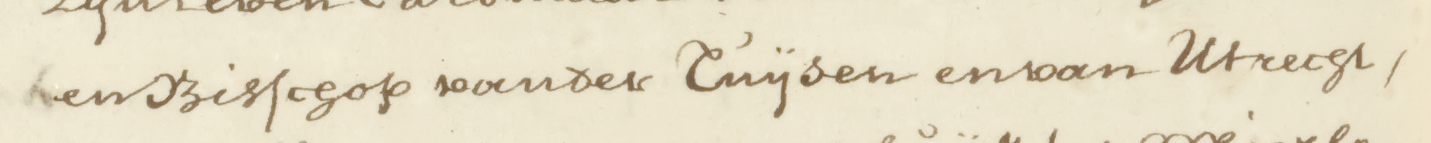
en bisschop vander Tuijsen en van Utrecht,
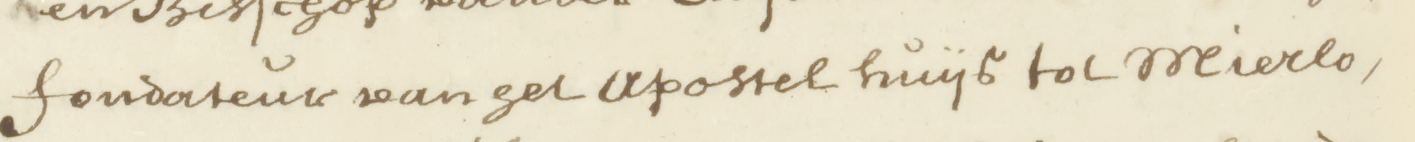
fondateur van het Apostel huijs tot Mierlo,
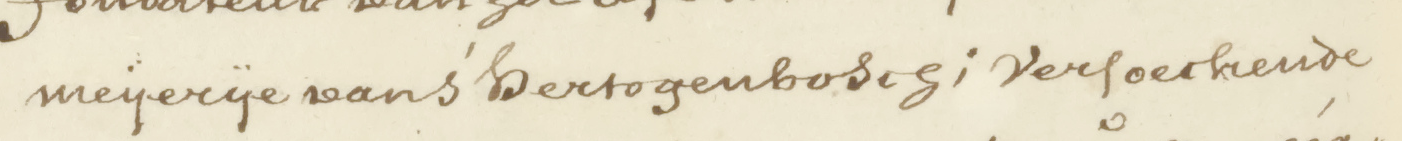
meijerije van s'Hertogenbosch; versoeckende
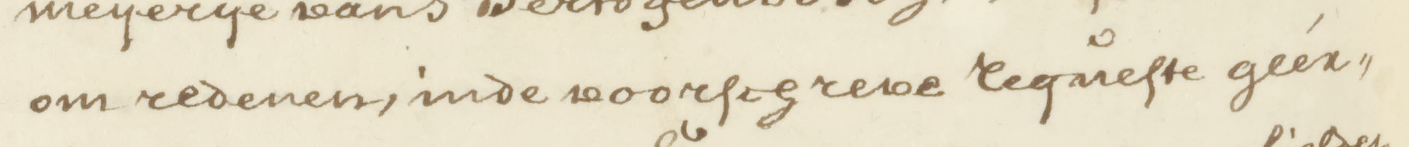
om redenen, inde voorschreve requeste geéx„
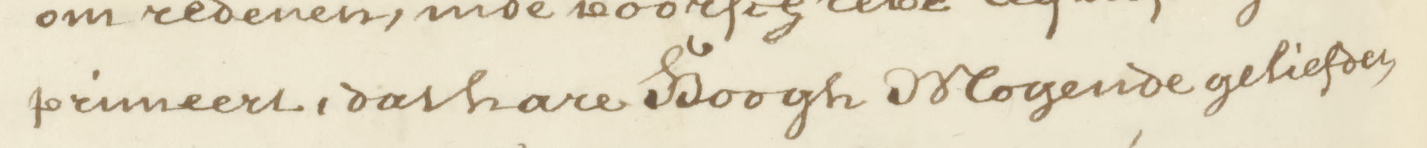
primeert, dat hare Hoogh Mogende geliefden
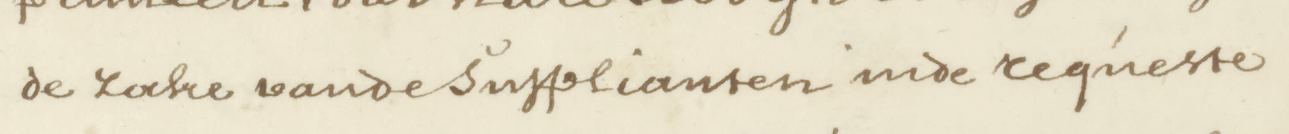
de zake vande supplianten inde requeste
